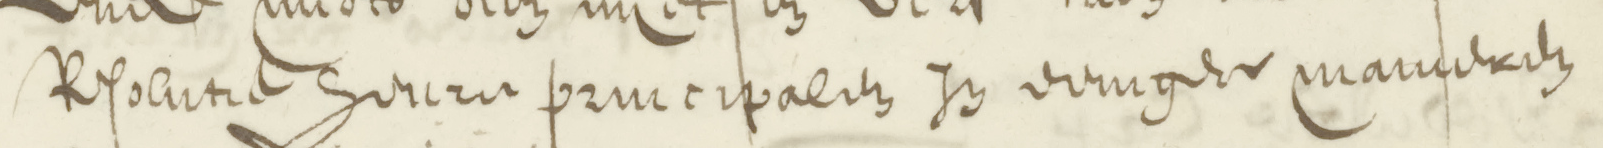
Resolutie heure principalen in eeniger manieren
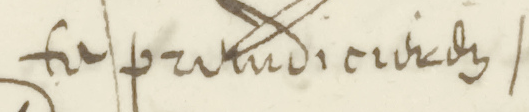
te preiudicieren.
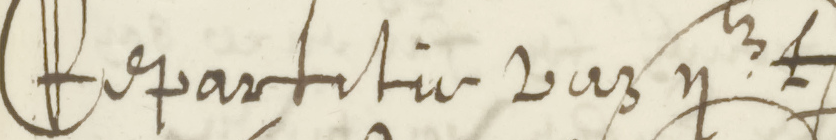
Repartitie van IIm lb.
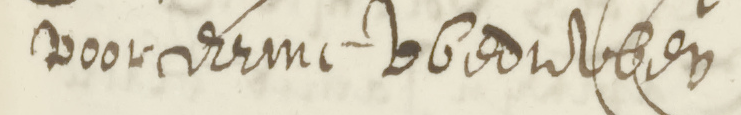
voor arme weduwen
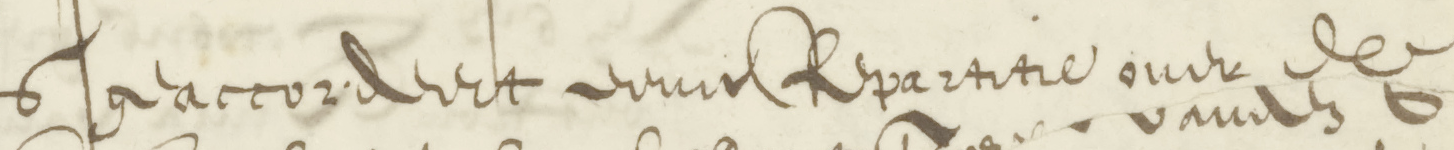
Is geaccordeert eene repartitie ouer de
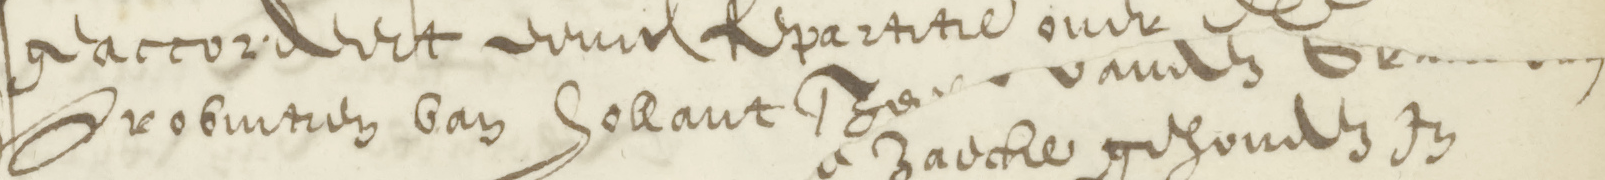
Provincien van hollant The vanden
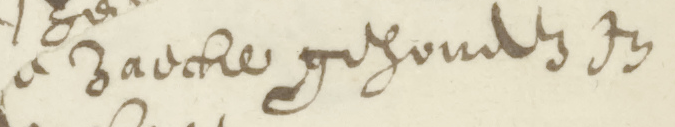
zaecke gehouden in
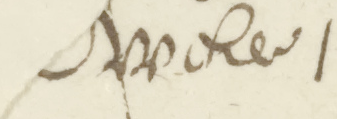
Wcke.
